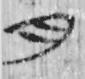月
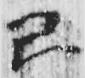己
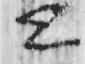巳
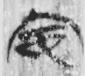{宀𠁩}
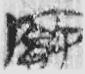○（厩）
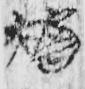○（胡）
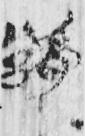豫
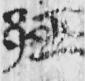亟（期）
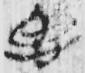思
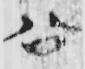公
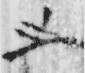之
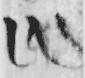州
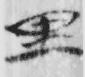里
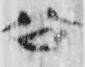公
